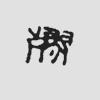{歺翏}
